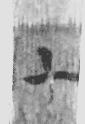七
